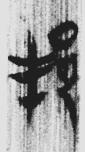邦（封）
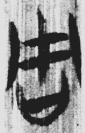周
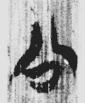公
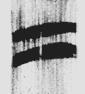二
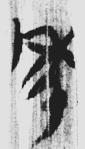年
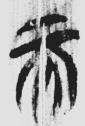而
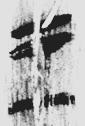王
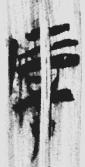○（重）
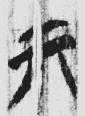亓（其）
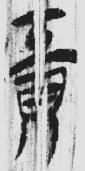○（任）
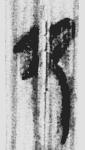乃
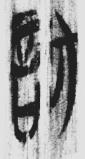訪
